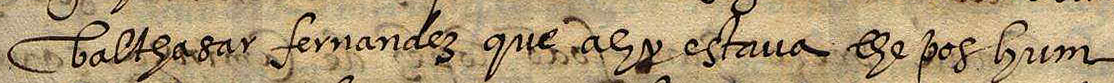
balthasar fernandez que ahy estaua lhe pos hum
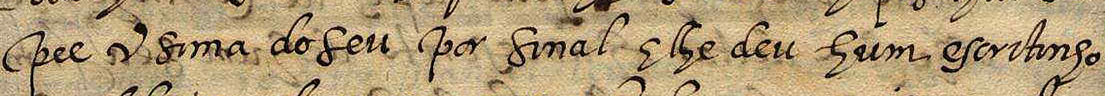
pee ē sima do seu por sinal E lhe deu hum escritinho
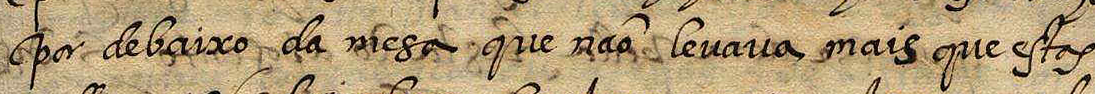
por debaixo da mesa que naõ leuaua mais que estas
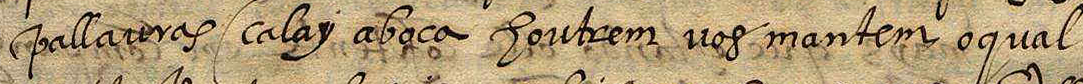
pallauras (calay a boca houtrem uos mantem o qual
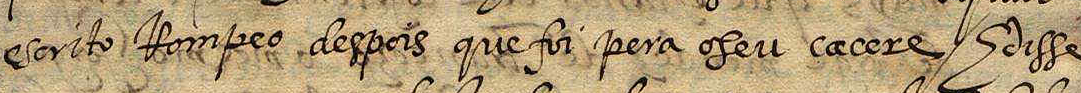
escrito Rompeo despois que foi pera o seu cacere / E disse
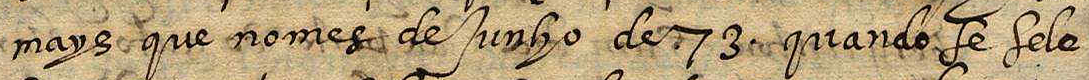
mays que no mes de Junho de 73. quando se sele
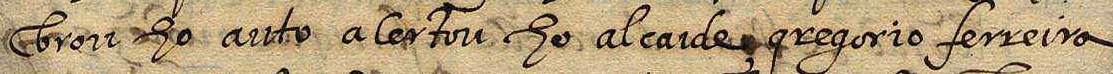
brou ho auto acertou ho alcaide gregorio ferreira
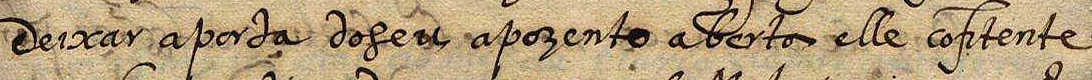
deixar a porta do seu apozento aberta elle cōfitente
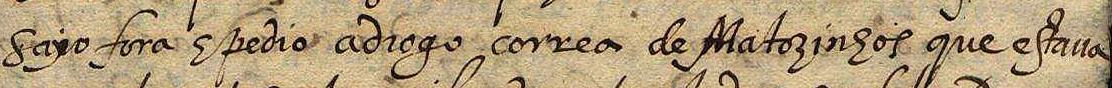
sayo fora E pedio a diogo correa de Matozinhos que estaua
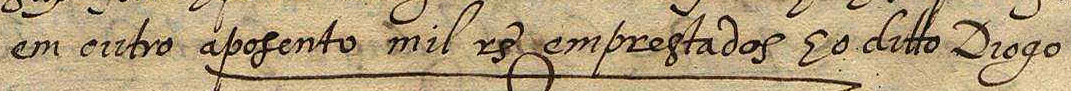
em outro aposento mil rs̄ emprestados E o ditto Diogo
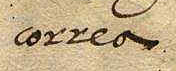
correa
